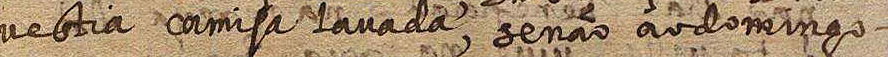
uestia camisa lauada, senão ao domingo
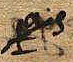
tas
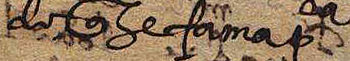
do q̄ he fama pca.
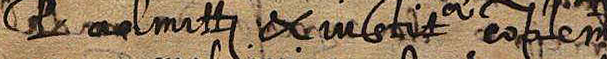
P admittj & iustita cōplemtuz
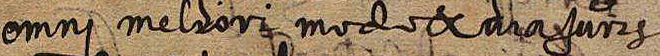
omnj meliori modo & uia Juris
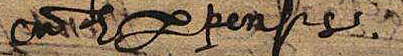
cū EXpensis.
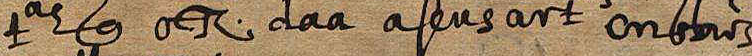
tas q̄ o R. daa a seus artos cristaõs
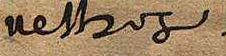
uelhos.
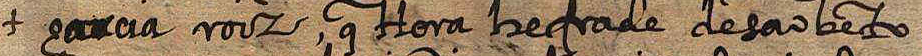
+ garcia roiz̄, q̄ Hora he frade de são bēto
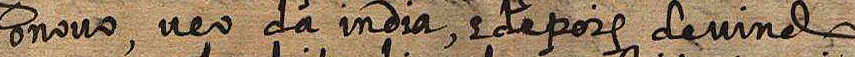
o nouo, ueo da india, E depois de uindo
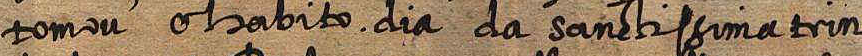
tomou o habito dia de sanctissima trin
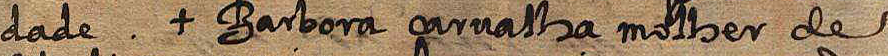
dade. + Barbora carualha molher de
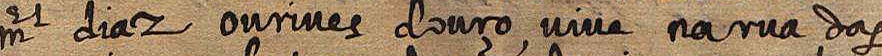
mEl diaz ouriues douro, uiue na rua das
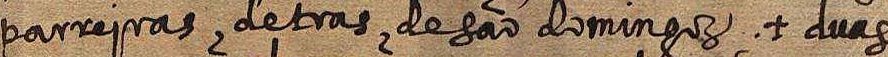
parreiras detras de são domingos + duas
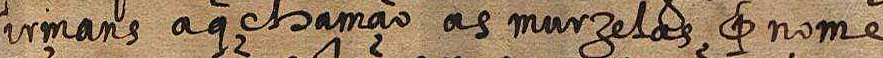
irmans a q̄ chamão as murzelas ꝑ nome
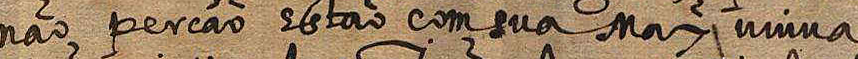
não percaõ Estaõ com sua Maȳ uiuua
